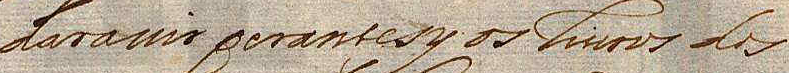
dara uir perante sy os Liuros dos
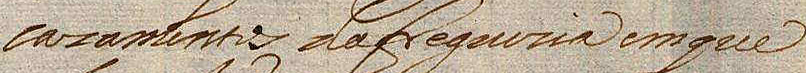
cazamentos da freguezia em que
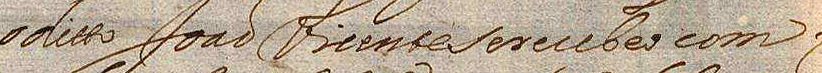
o ditto João Vicente se reçebeo com
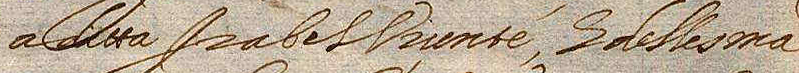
a ditta JsabeL Viçente, E delles mā
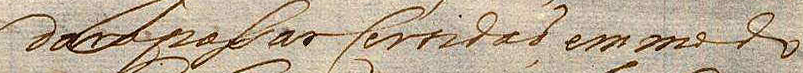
dara passar Certidão, em modo
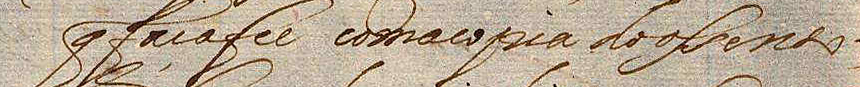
q̄ faça fee com a copia do assento,
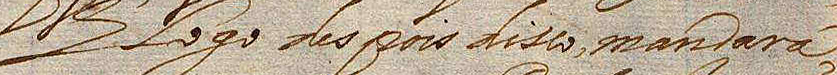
E Logo despois disso, mandara
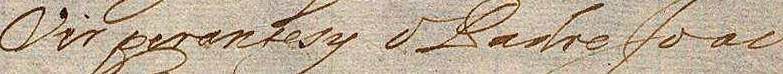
Vir perante sy o Padre Joaõ
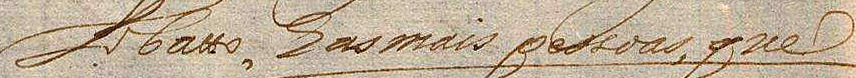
Lobatto, E as mais pessoas, que
